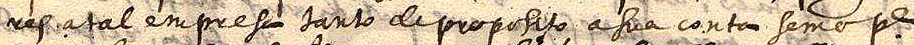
res a tal empresa tanto de proposito a sua conta sem o p.e
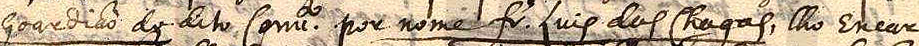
Goardiaõ do dito Conuto. por nome fr. Luis das Chagas, lho Encar
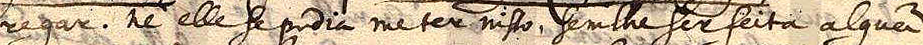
regar. Nē elle se podia meter nisso, sem lhe ser feita alguā
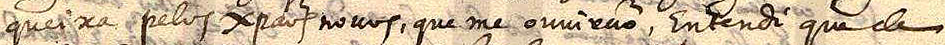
queixa pelos xpaõs nouos, que me ouuiraõ, Entendi que de
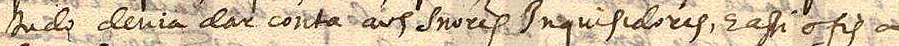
tudo deuia dar conta aos snorēs Inquisidores, E assi o fis a
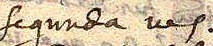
segunda ues.
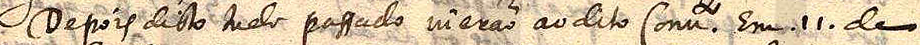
Depois disto tudo passado uieraõ ao dito Conuto. Em .11. de
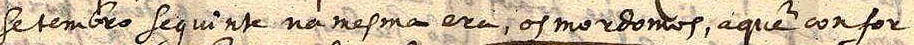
setembro seguinte na mesma era, os mordomos, a quē confor
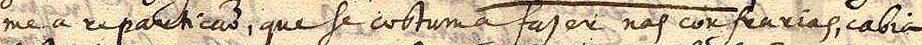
me a reparticaõ, que se costuma a fazer nas confrarias, cabia
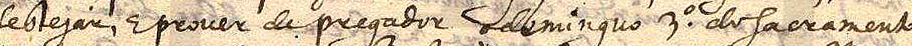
festejar, E prouer de pregador o dominguo 3.o do sacramento
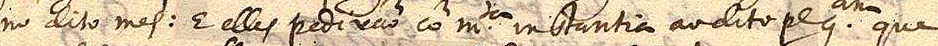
no dito mes: E elles pediraõ cō m.ta instantia ao dito pe g.am que
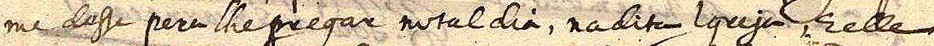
me desse pera lhe pregar no tal dia, na dita Igreja, E elle
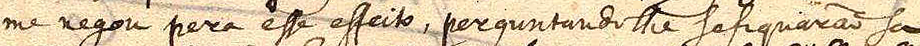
me negou pera esse effeito, perguntandolhe se fiquarão sa
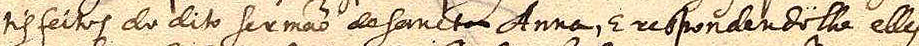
tisfeitos do dito sermão de sancta Anna, E respondendolhe elles
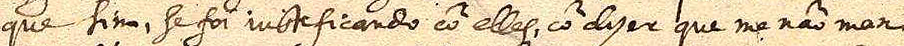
que sim, se foi iusteficando cō elles, cō dizer que me não man
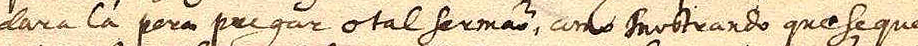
dara lá pera pregar o tal sermaõ, como mostrando que se que
